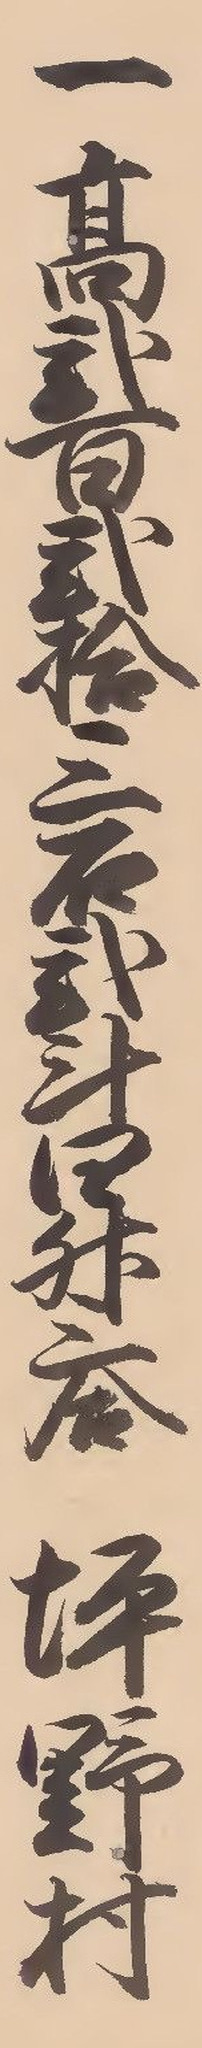一高弐百弐拾三石弐斗四升三合坪野村

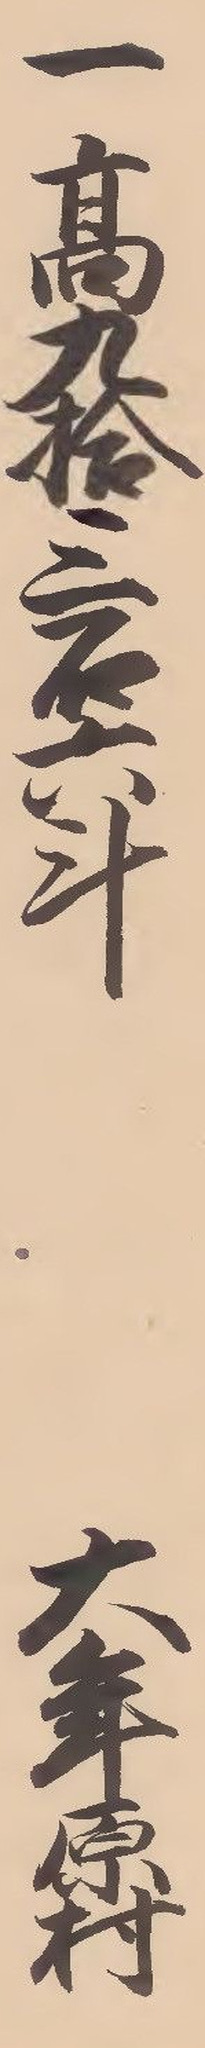一高九拾三石六斗大年原村
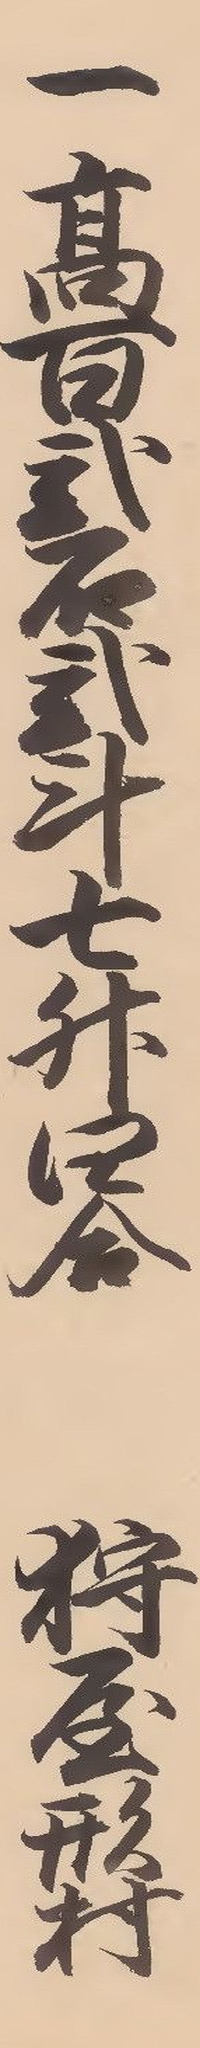一高百弐石弐斗七升四合狩屋形村
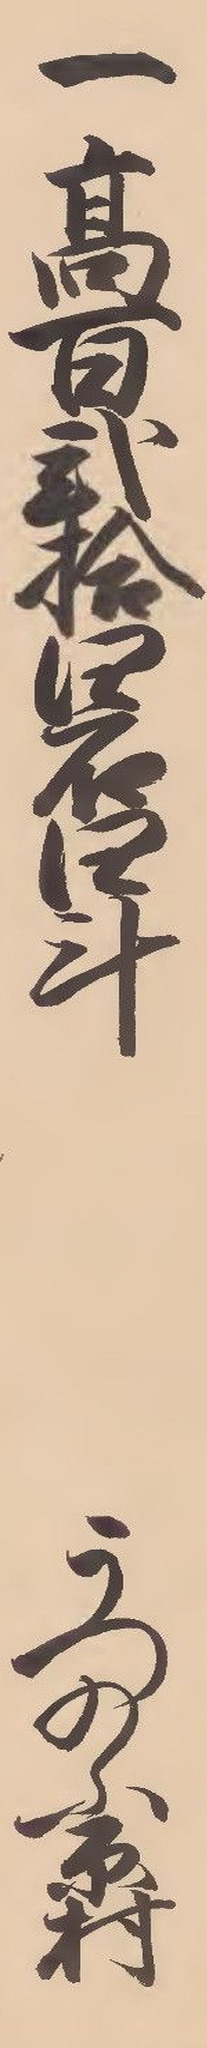一高百弐拾四石四斗うつのふ原村
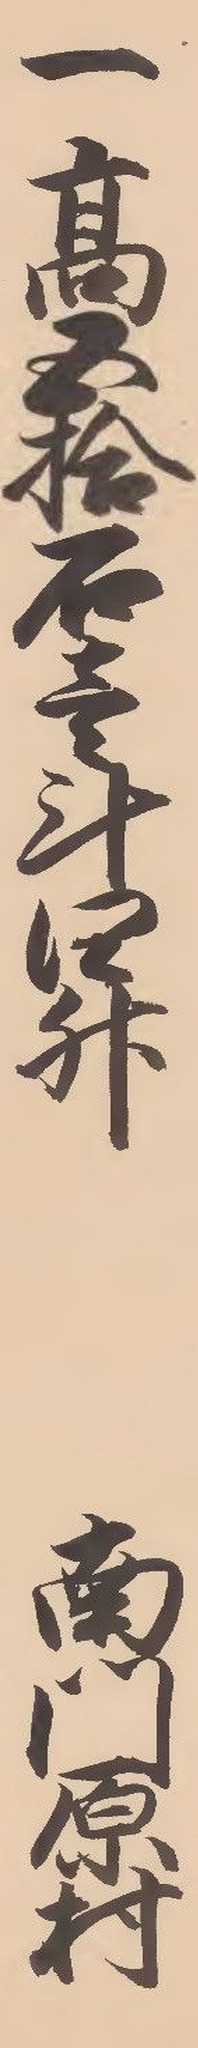一高五拾石壱斗四升南門原村
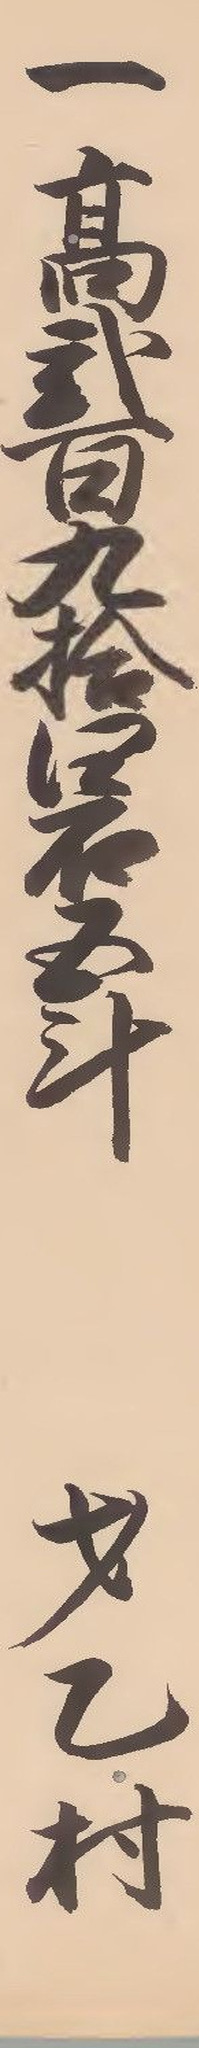一高弐百九拾四石五斗才乙村
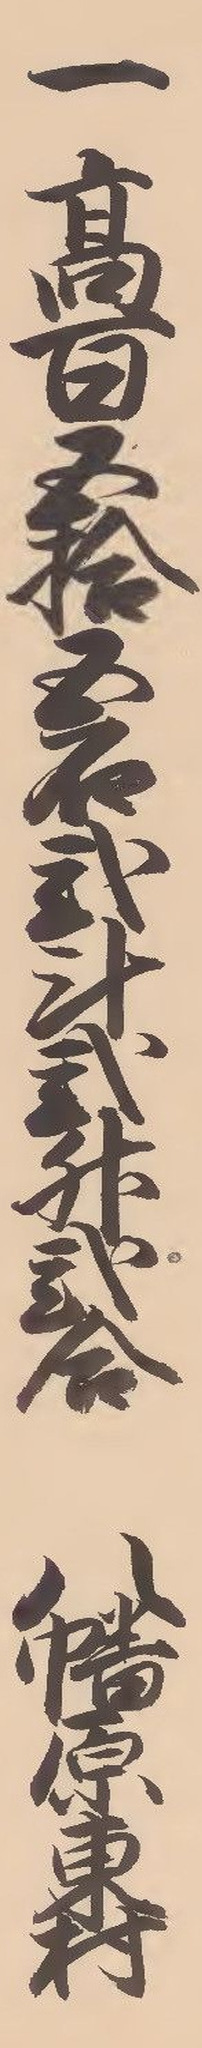一高百五拾五石弐斗弐升弐合八幡原東村

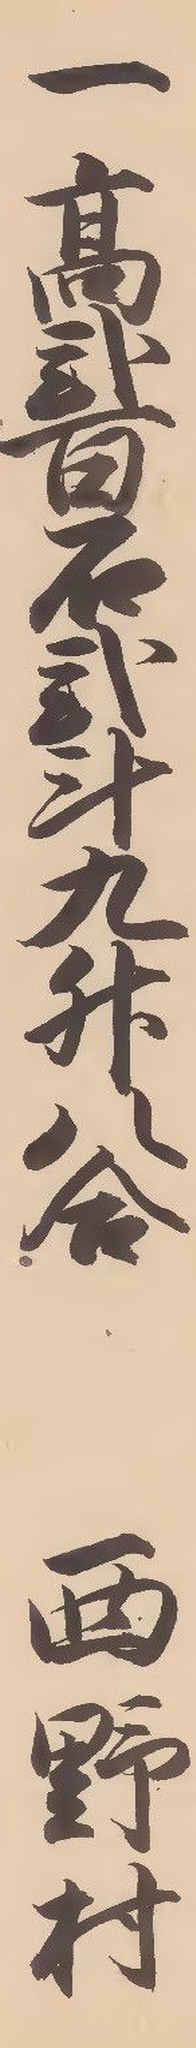一高弐百石弐斗九升八合西野村
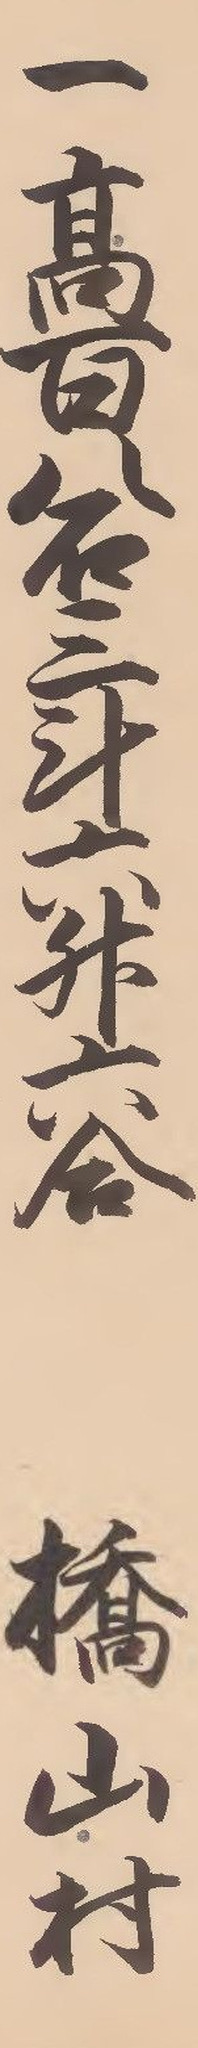一高百八石三斗六升六合橋山村
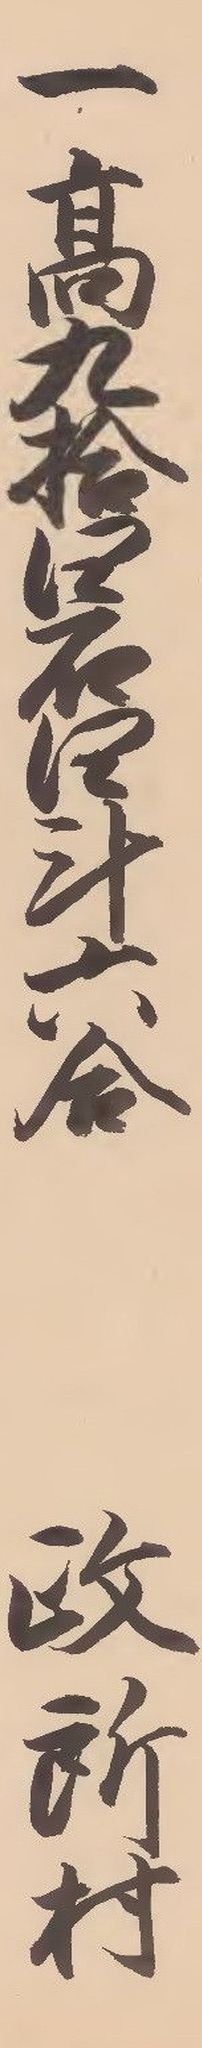一高九拾四石四斗六合政所村
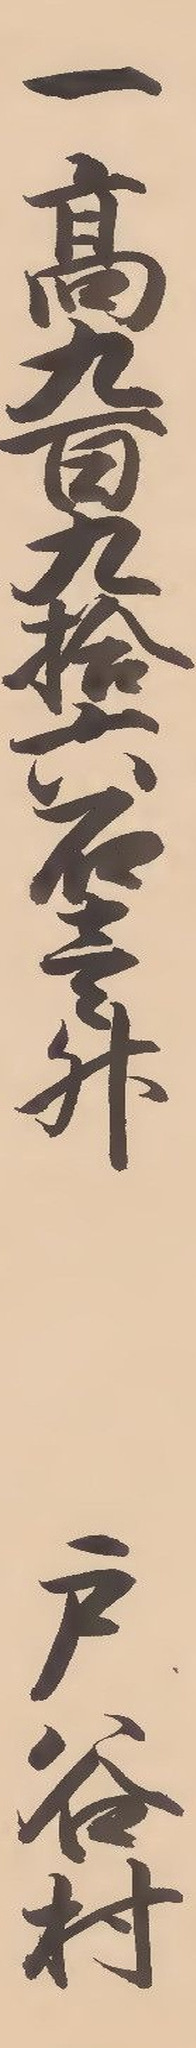一高九百九拾六石壱升戸谷村
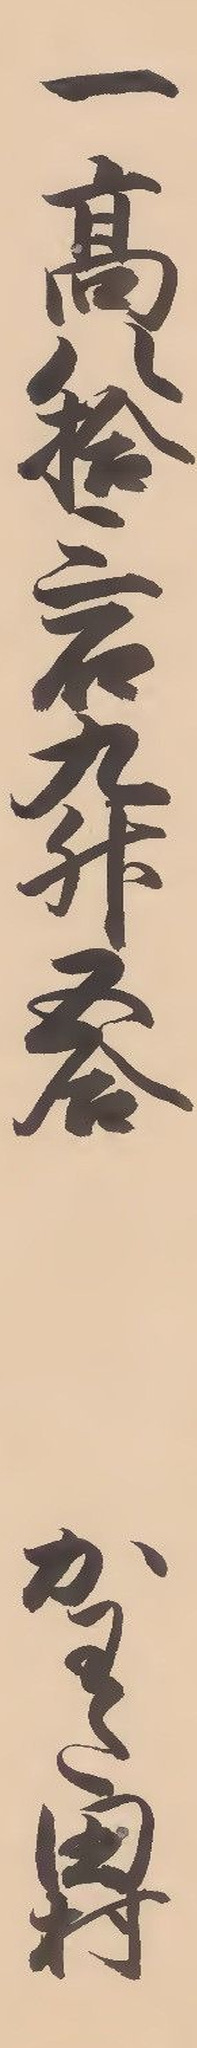一高八拾三石九升五合かわた田村
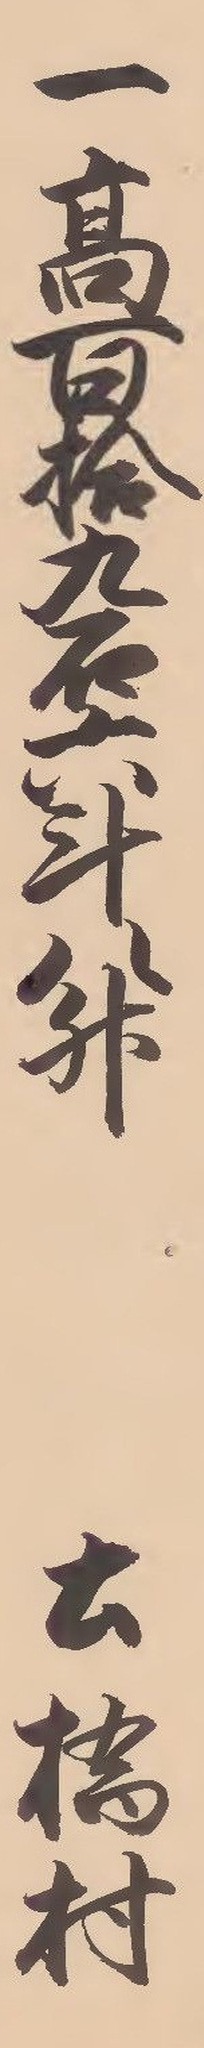一高百拾九石六斗八升土橋村

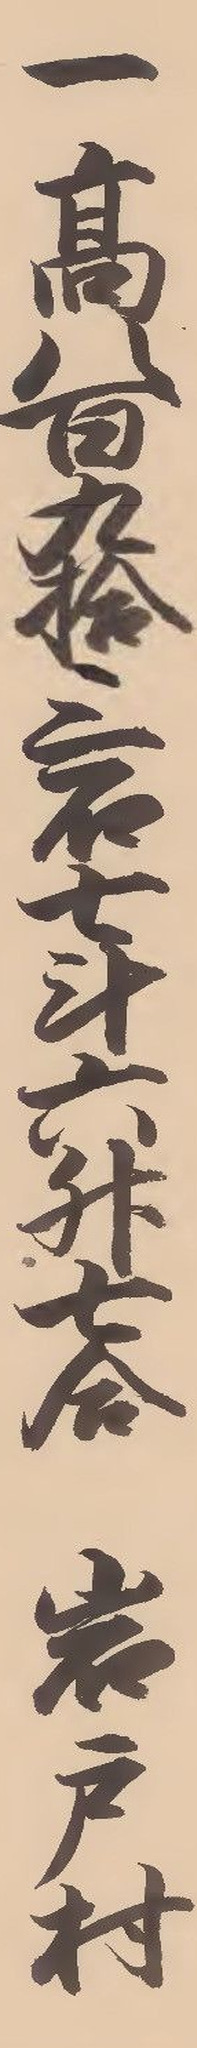一高八百九拾三石七斗六升七合岩戸村
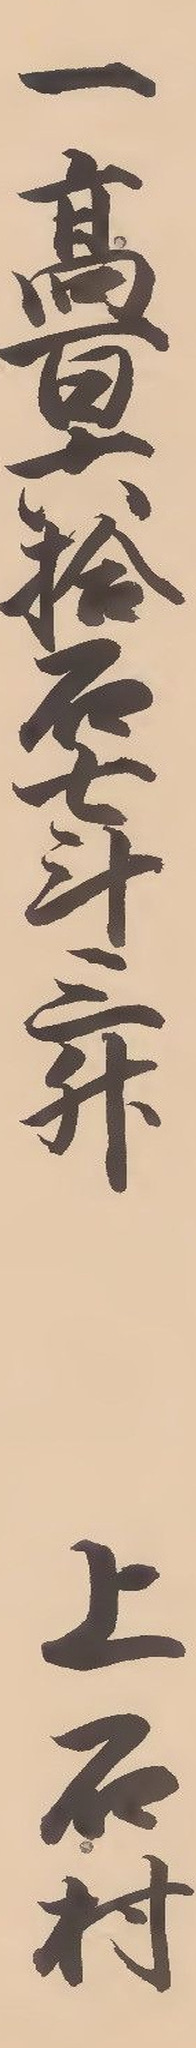一高百六拾石七斗三升上石村
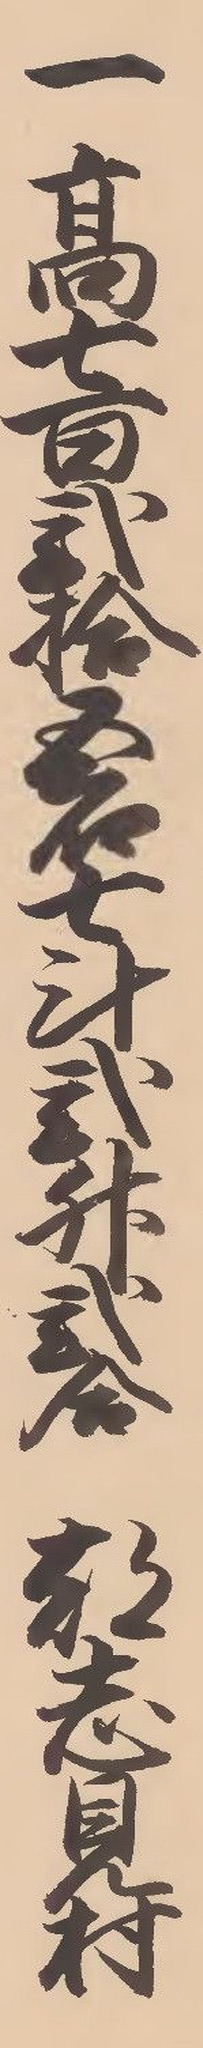一高七百弐拾五石七斗弐升弐合都志見村
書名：安芸国郷帳
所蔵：国立公文書館 National Archives of Japan
